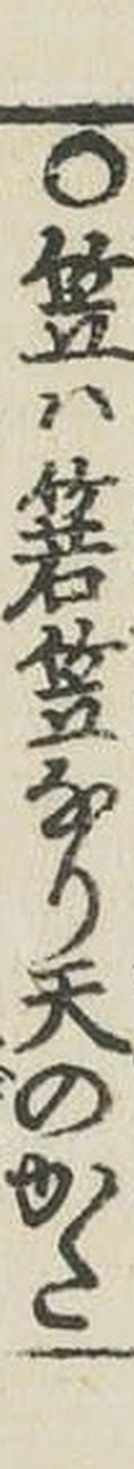○笠は箬笠なり天のかた
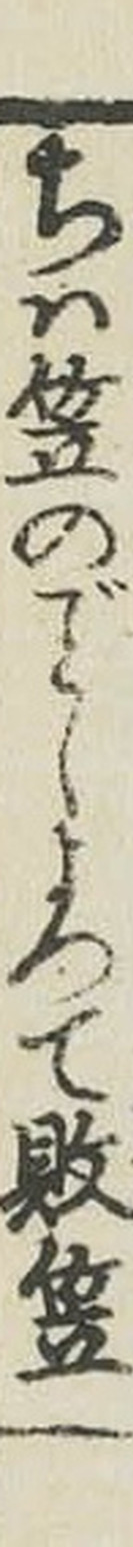ちは笠のごとしよつて敗笠
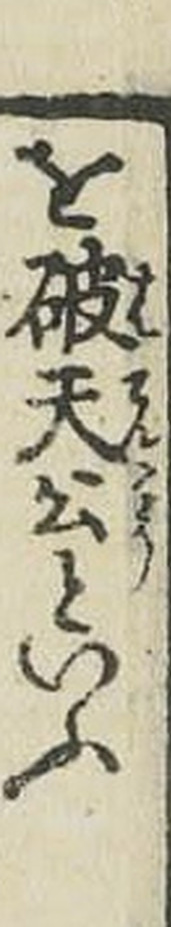を破天公といふ
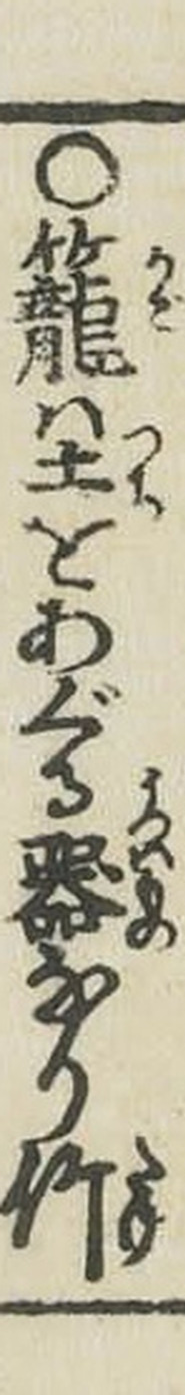○籠は土をあぐる器なり竹
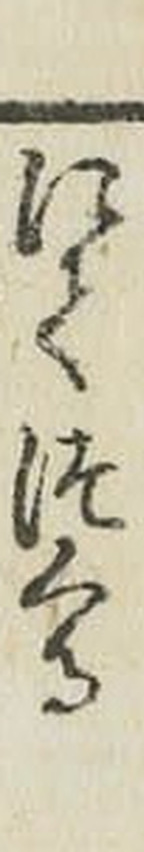にてつくる
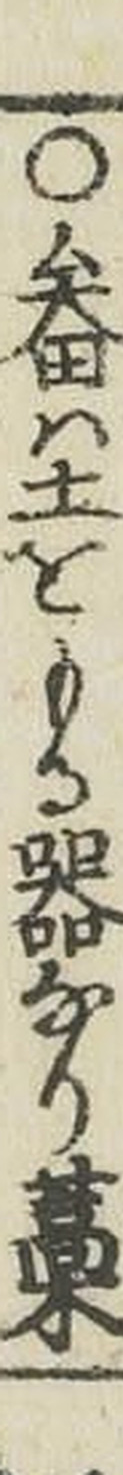○畚は土をもる器なり藁
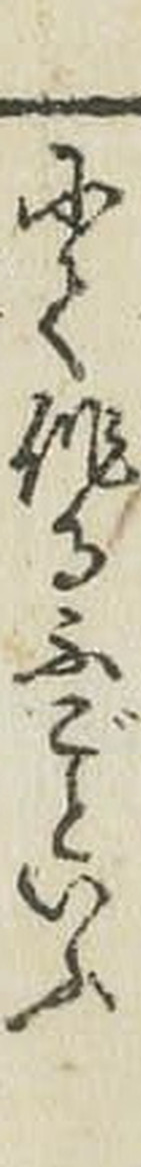にて作るふごといふ
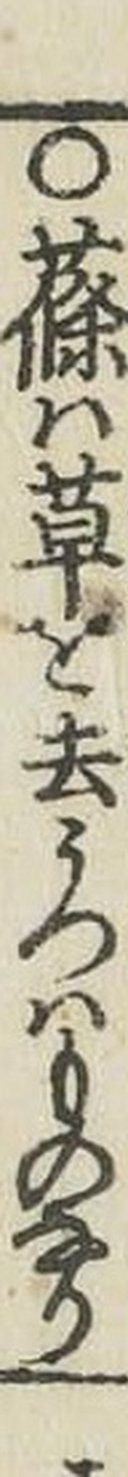○蓧は草を去うつはものなり
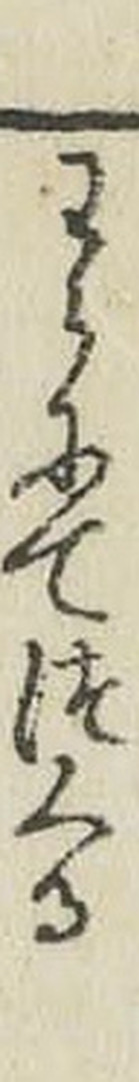わらにてつくる
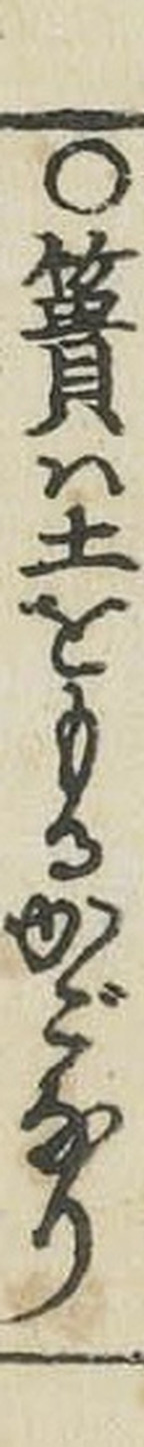○簣は土をもるかごなり
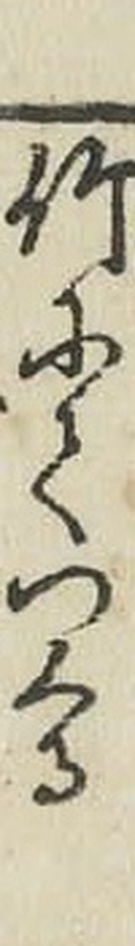竹にてつくる
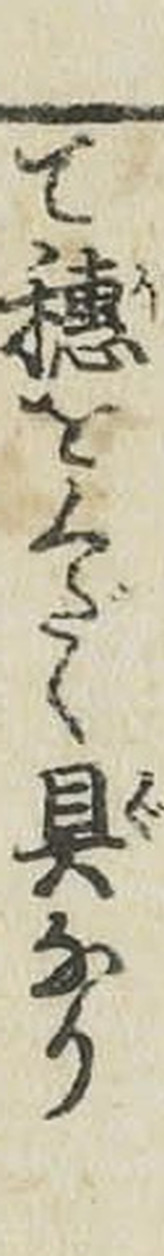て穂をくだく具なり
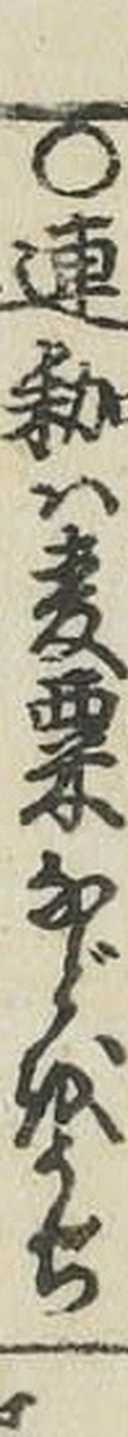○連耞は麦粟などをうち
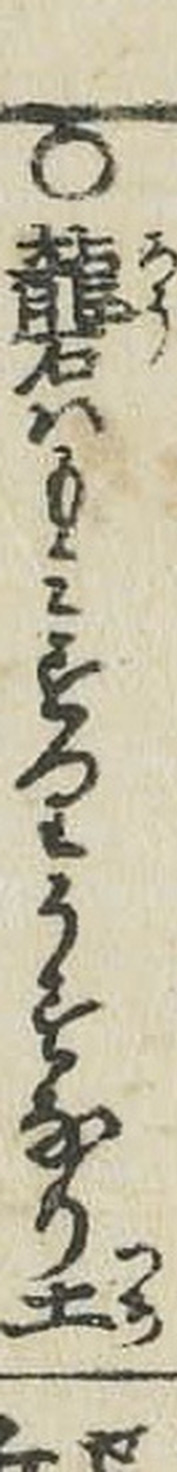○礱はもみすりうすなり土
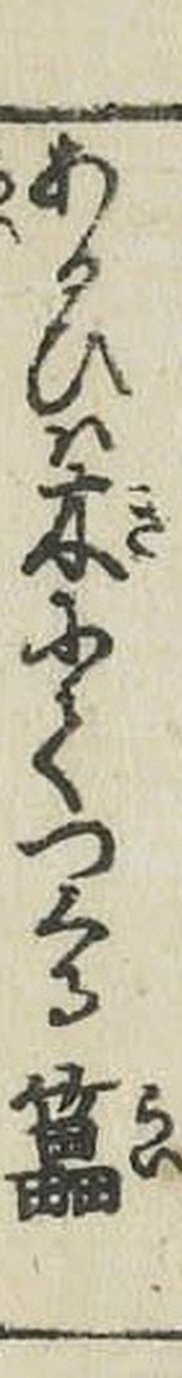あるひは木にてつくる？
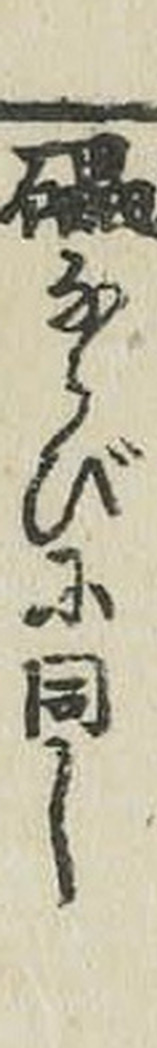礧ならびに同し
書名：増補頭書訓蒙図彙大成 10巻 5:巻之9-11
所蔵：東京学芸大学教育コンテンツアーカイブ
